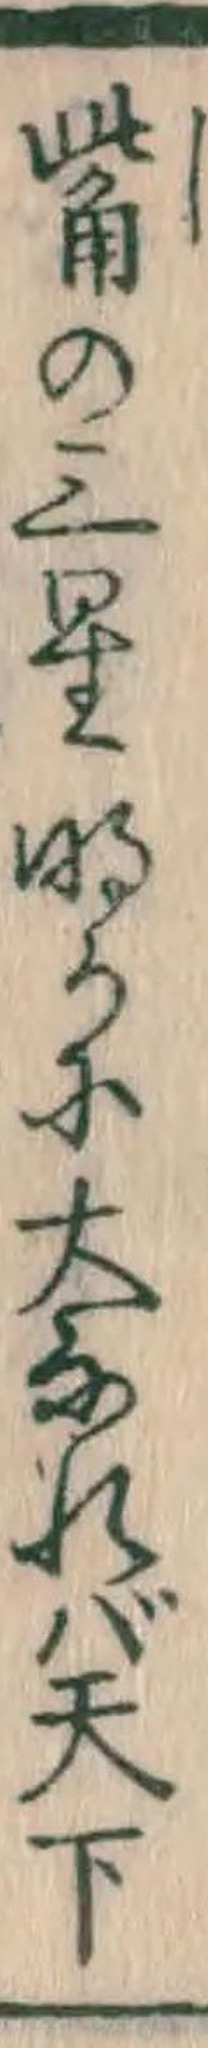觜の三星明かに大なれば天下
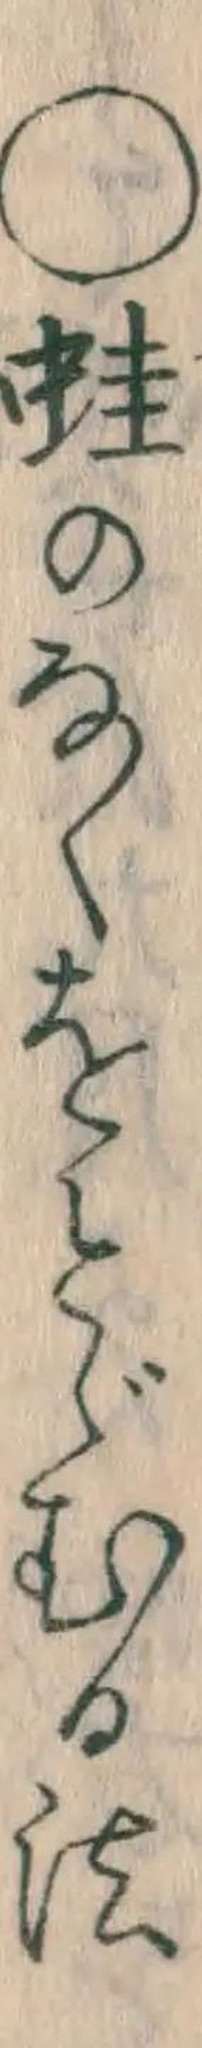○蛙のなくをとゞむる法
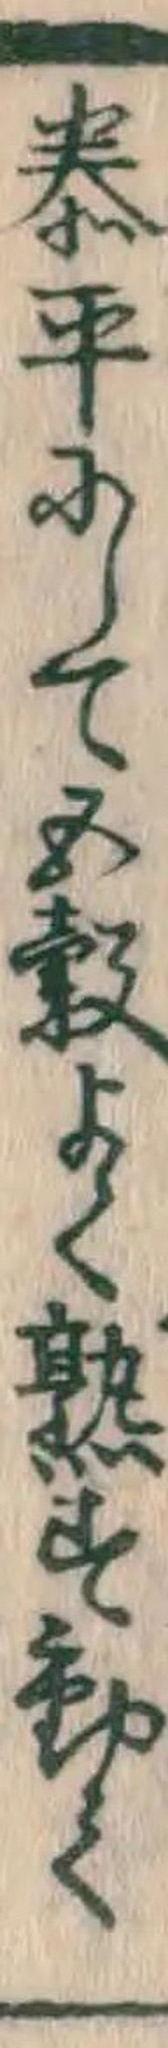泰平にして五穀よく熟す動て
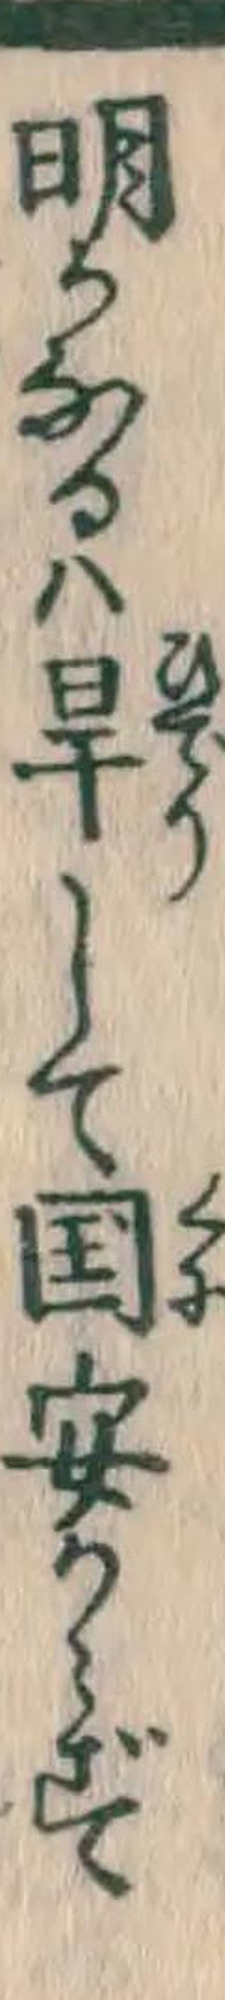明かなるは旱して国安からず
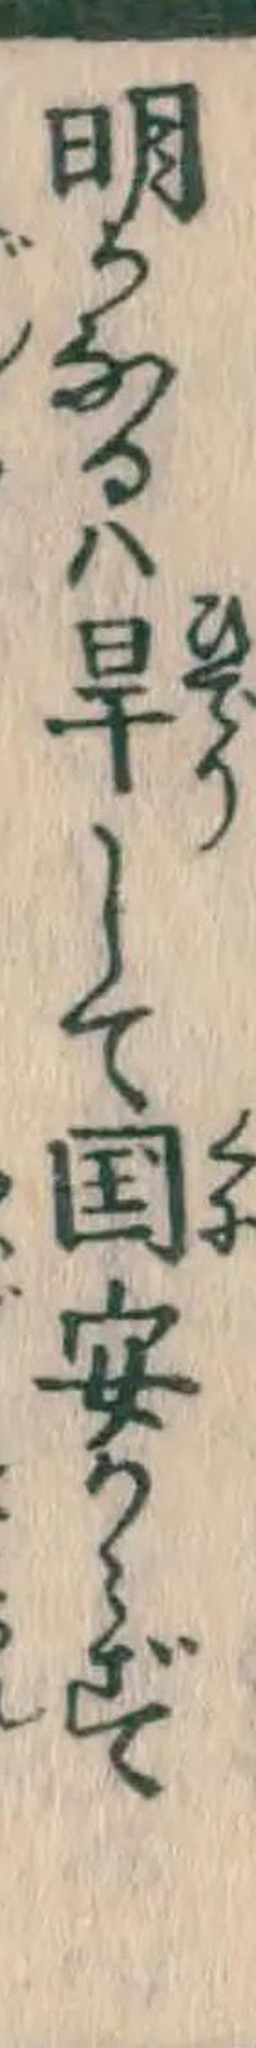明かなるは旱して国安からず
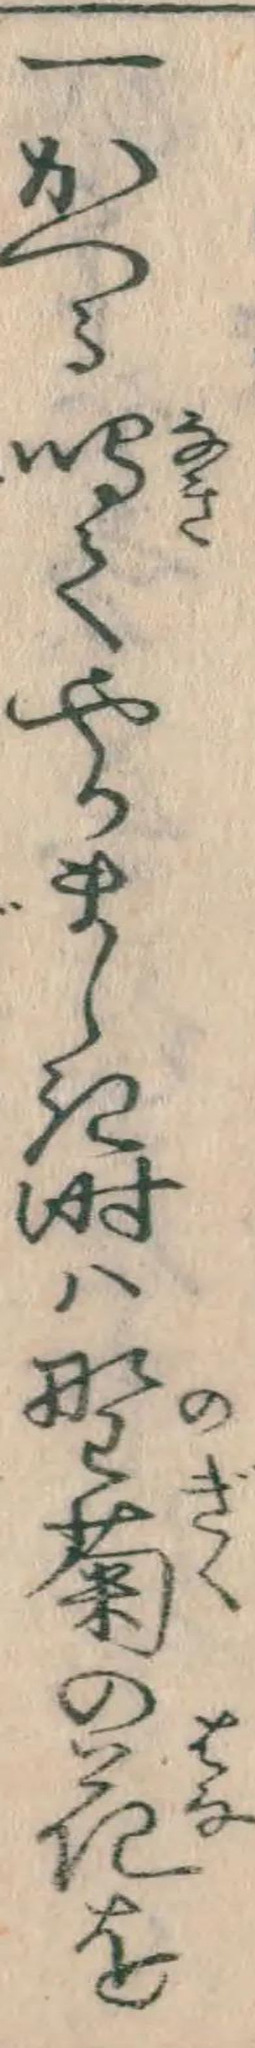一かへる鳴てやかましき時は野菊の花を
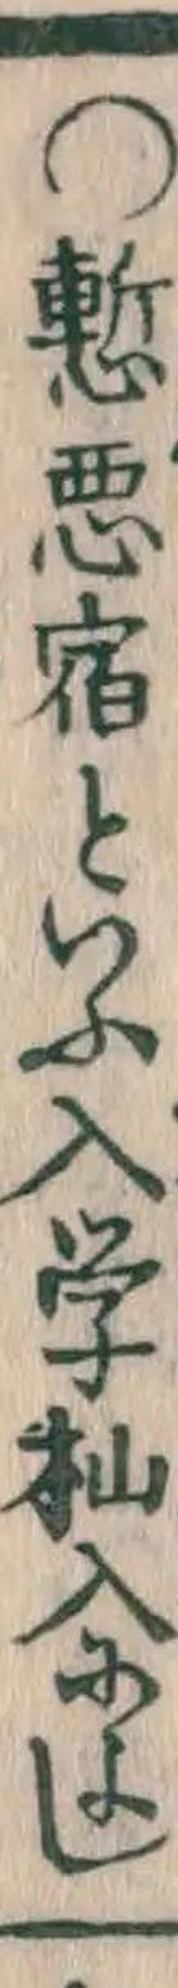○慙悪宿といふ入学杣入によし
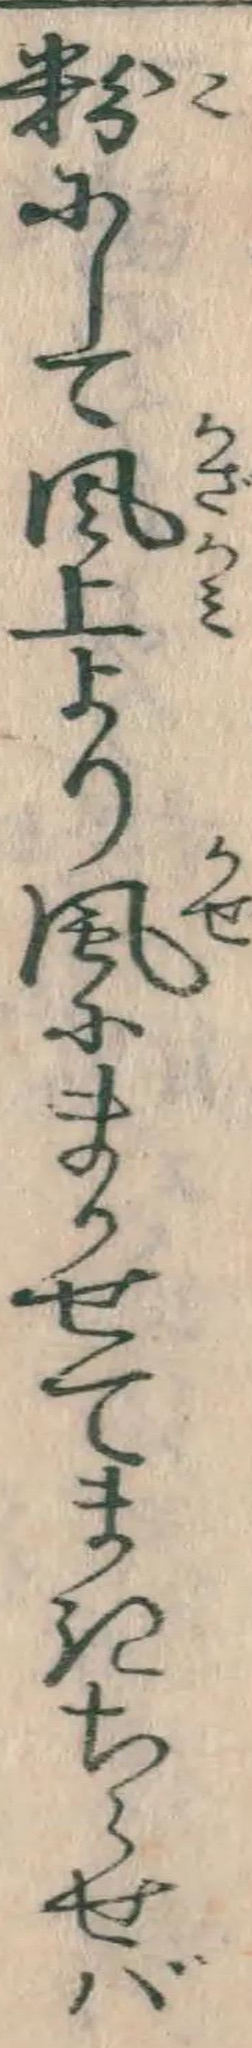粉にして風上より風にまかせてまきちらせば
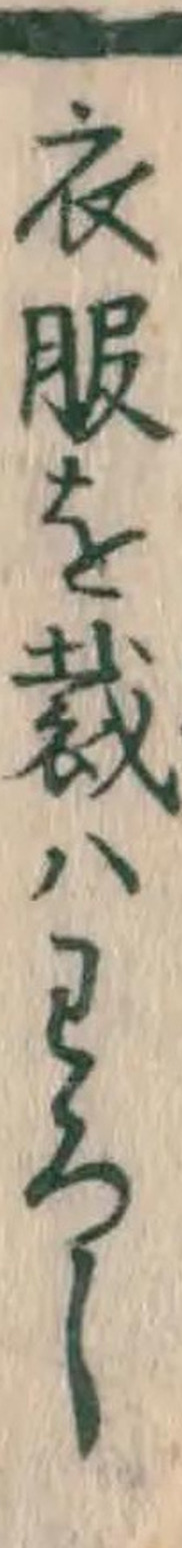衣服を裁はわろし
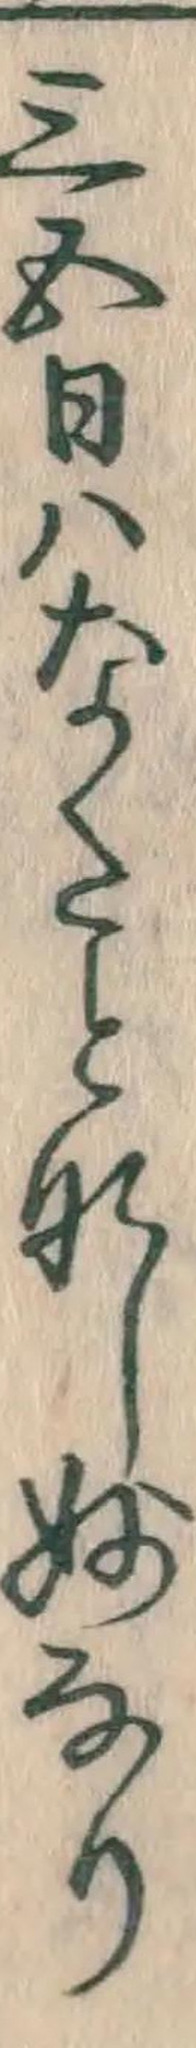三五日はなくことなし妙なり
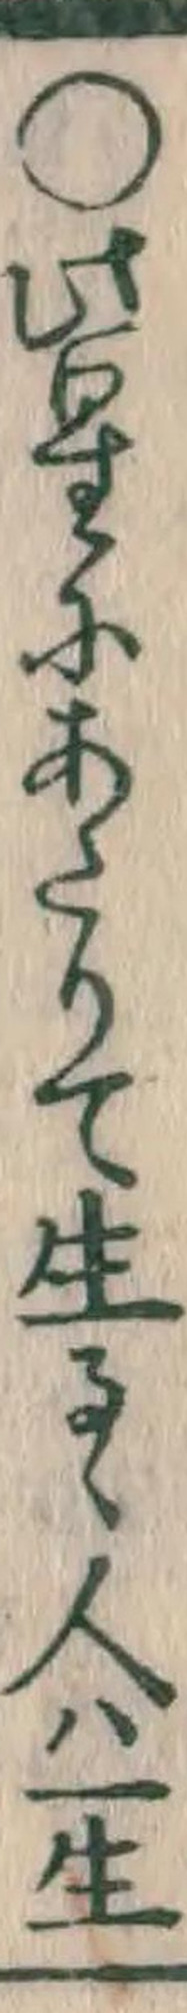○此星にあたりて生るゝ人は一生
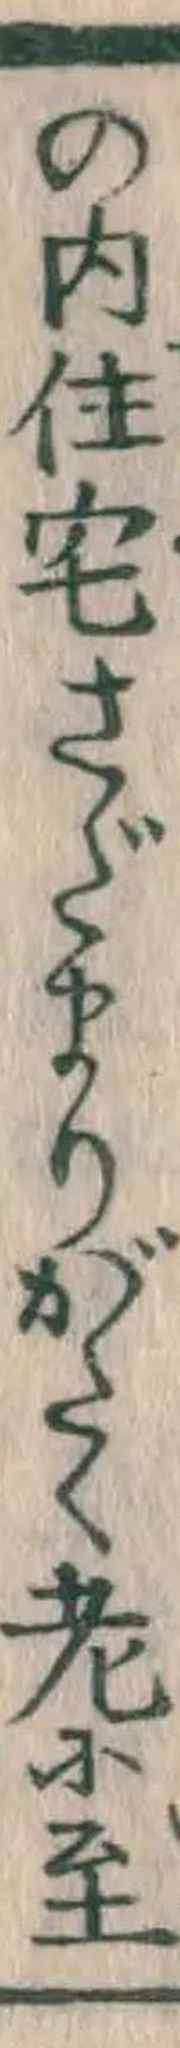の内住宅さだまりがたく老に至
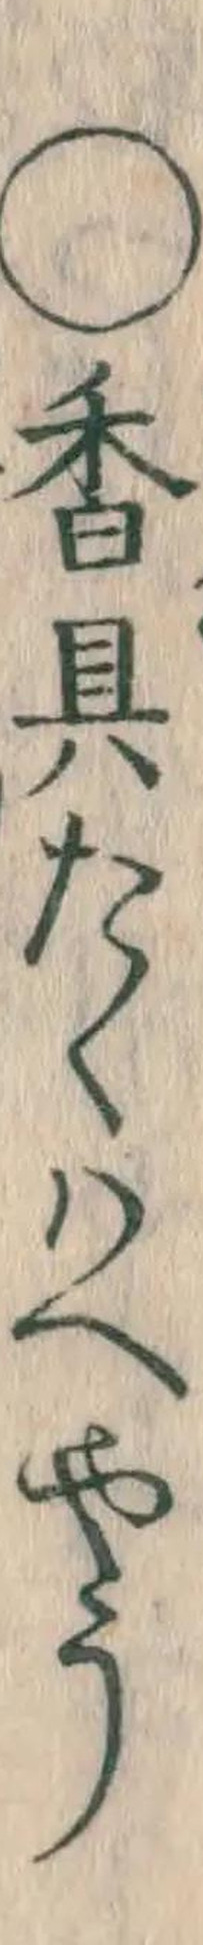○香具のたくはへやう
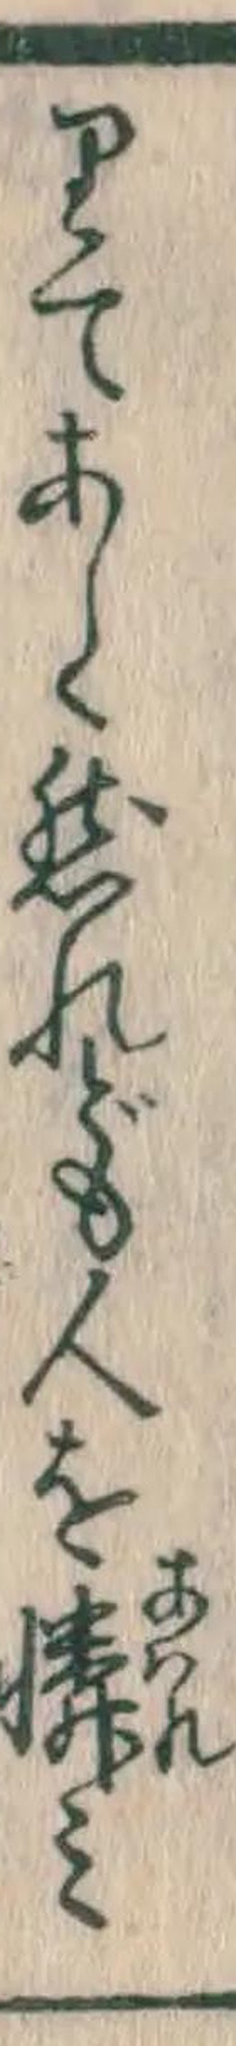りてあしく然れども人を憐み
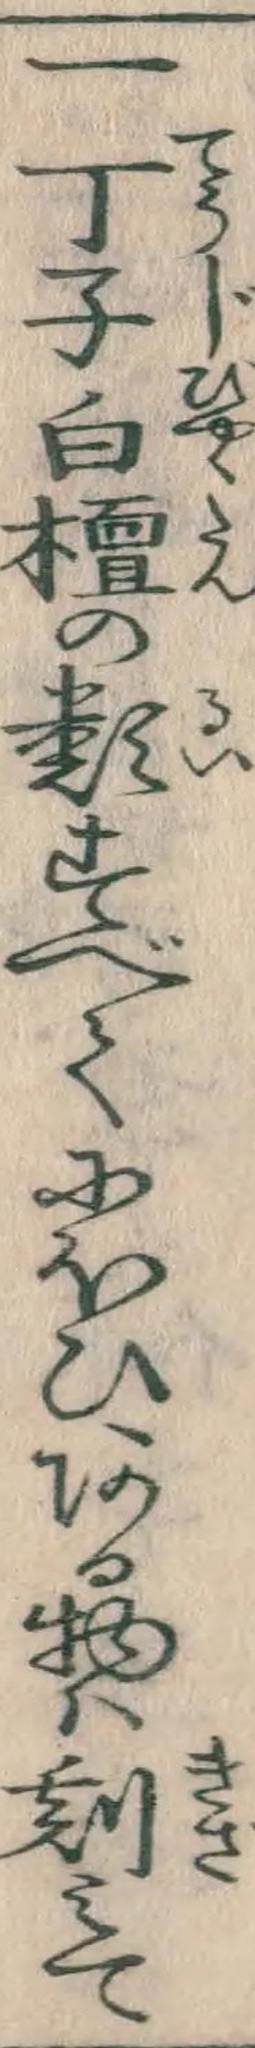一丁子白檀の類すべてにほひある物は刻みて
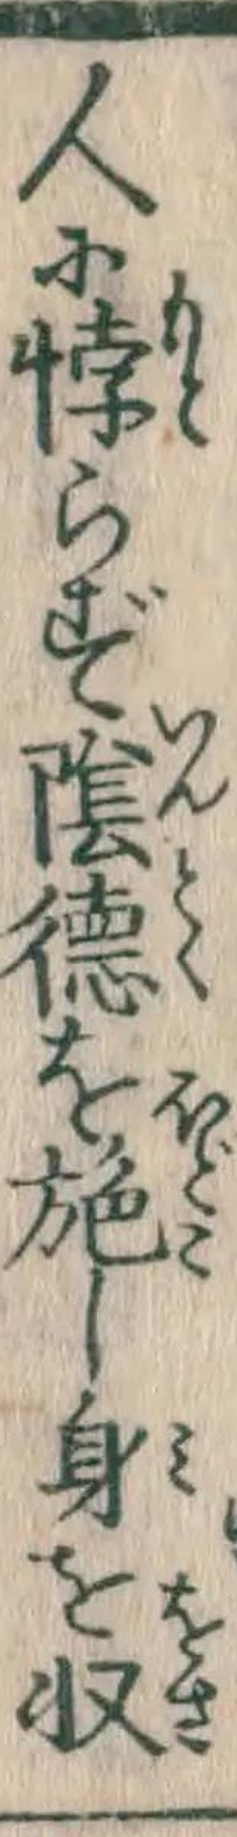人に悖らず陰徳を施し身を収
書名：広益秘事大全 3巻. [2]
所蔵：国立国会図書館 National Diet Library, JAPAN
